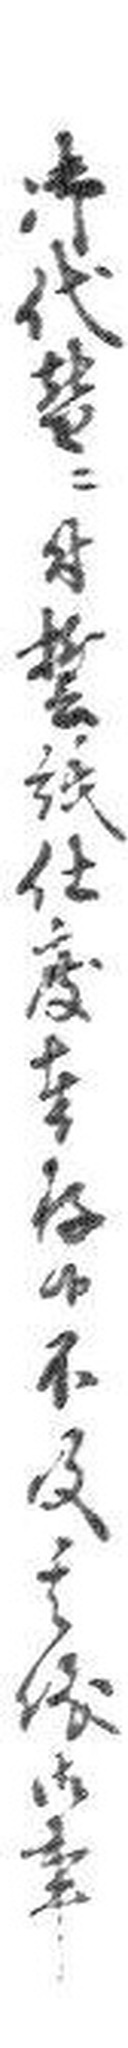御代替ニ付誓紙仕度奉存候不及其儀御事
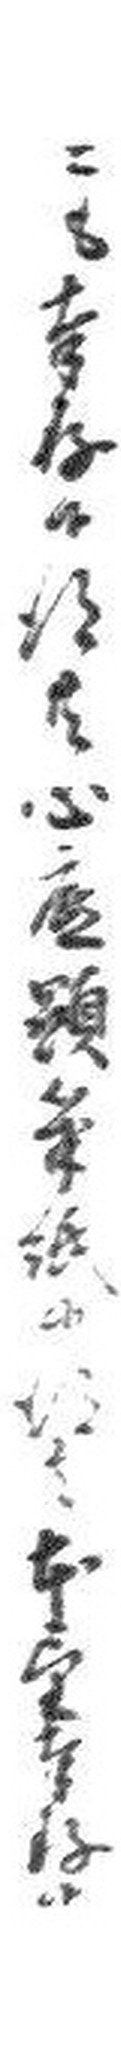ニも奉存候得共心底顕筆紙候得者本望奉存候
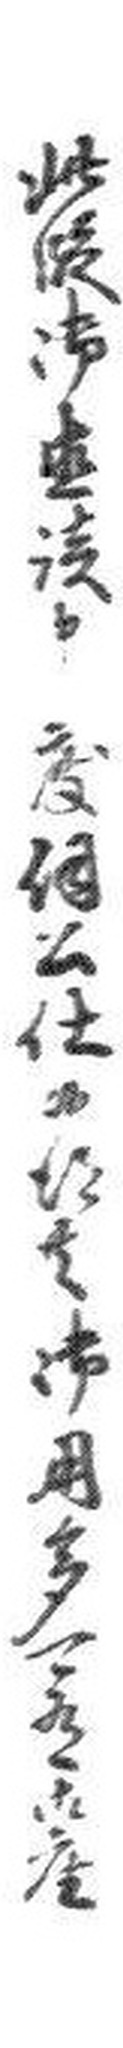此段御直談申度伺公仕候得共御用多可有御座
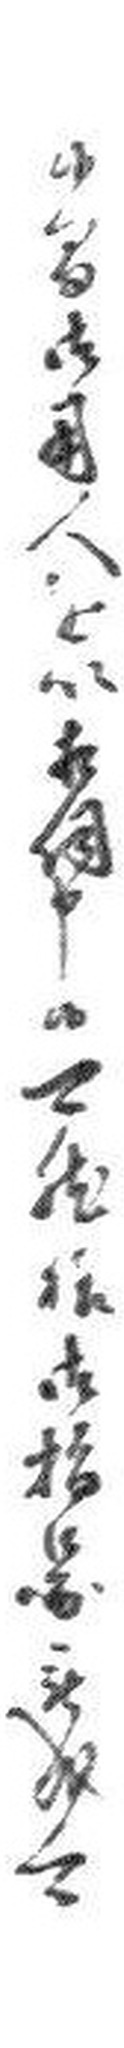候間御用人を以相伺申候可然様御指図被成可
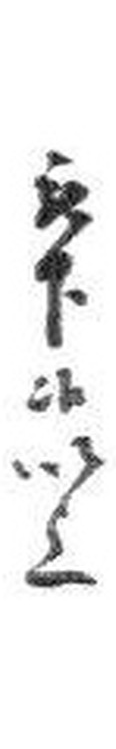被下候以上
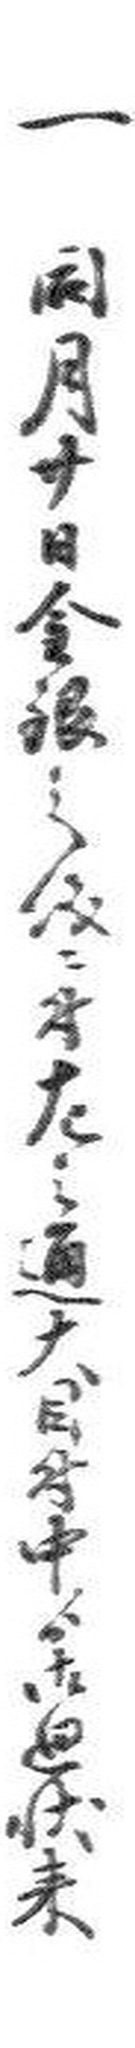一同月廿日金銀之儀ニ付左之通大目付中ゟ御廻状来
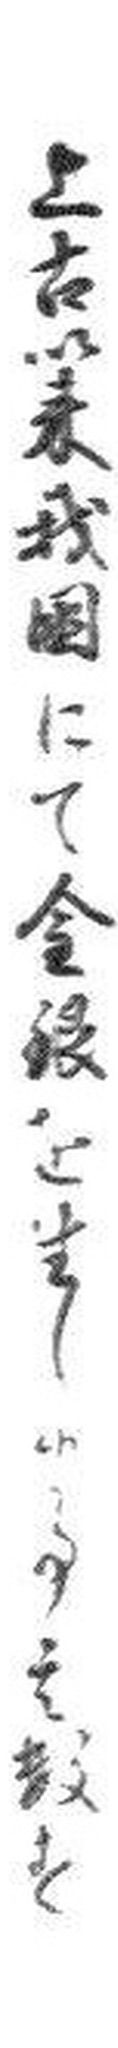上古以来我国にて金銀を生し候事数す
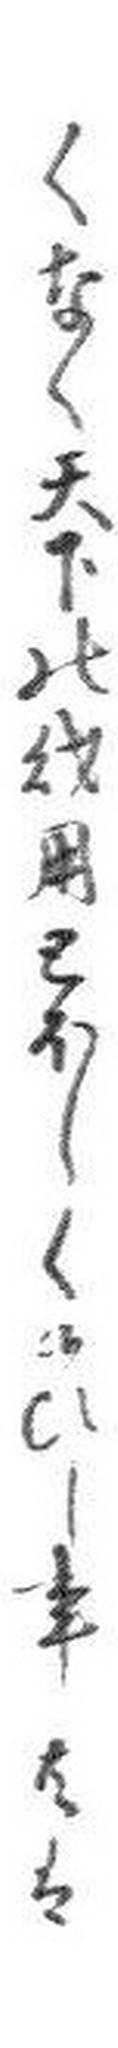くなく天下の財用とほしく候ひし事共は

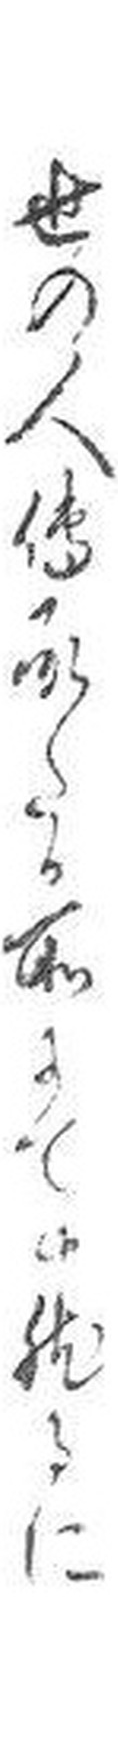世の人伝承たる所にて候然るに
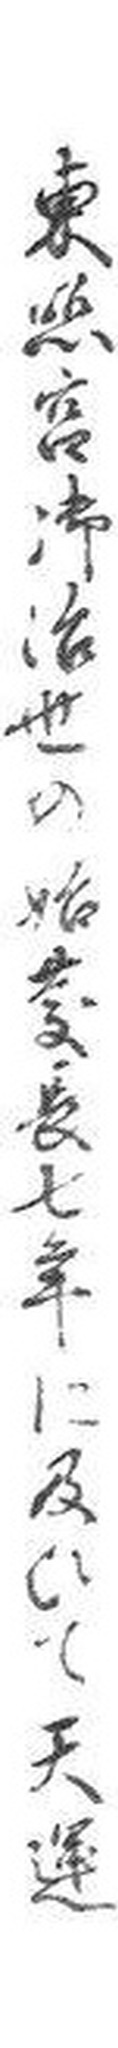東照宮御治世の始慶長七年に及ひて天運
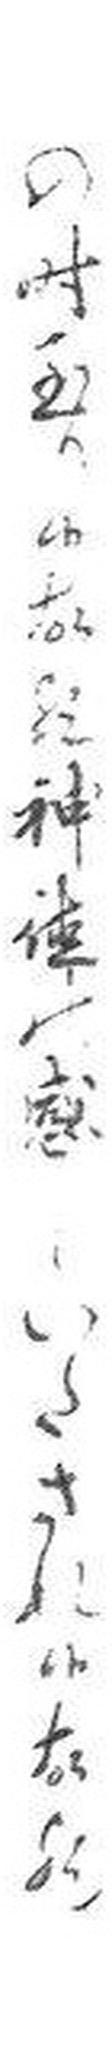の時至り候故歟神徳の感しいたされ候故歟
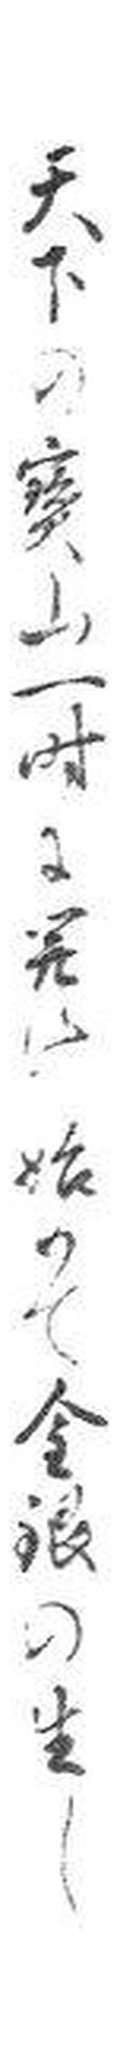天下の宝山一時に開け始めて金銀の生し
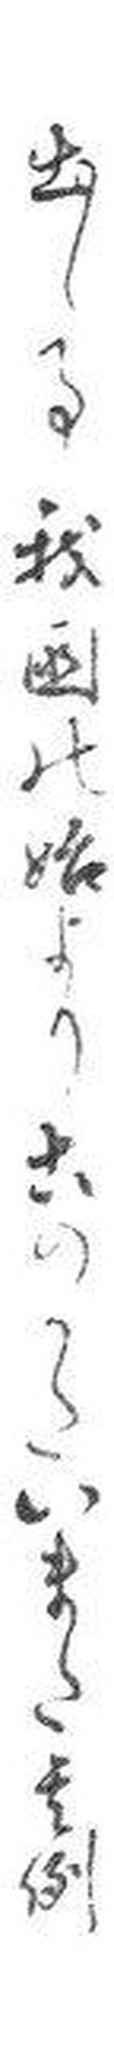出候事我国の始よりこのかたいまた其例
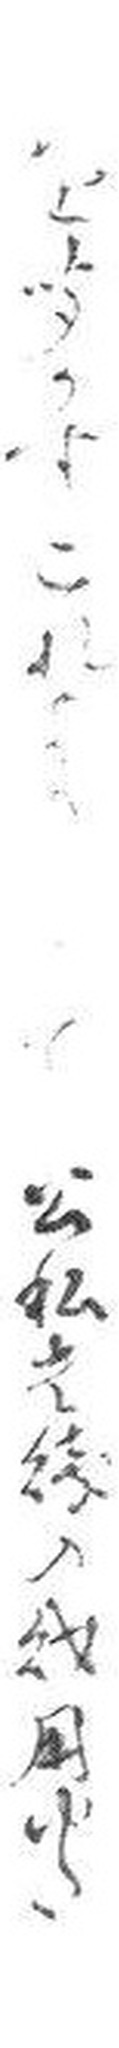を聞かすこれよりして公私貴賤の財用ゆた
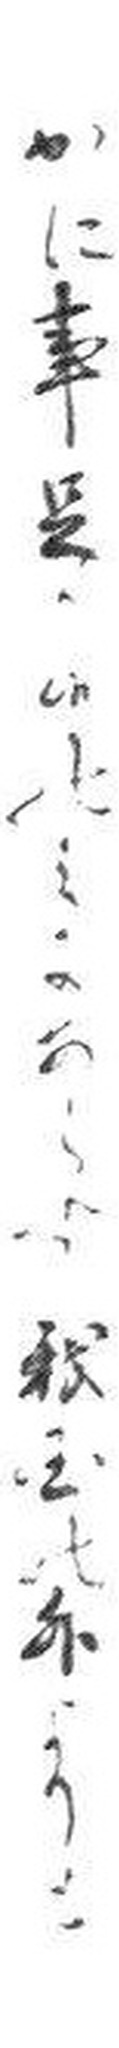かに事足り候のミにあらす我国の外よりも
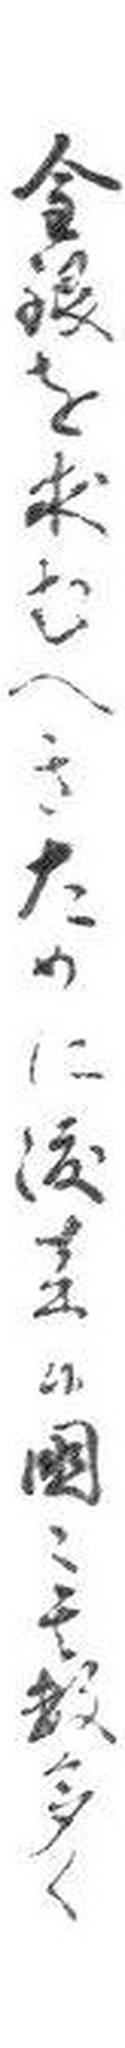金銀を求むへきために渡来候国々其数多く
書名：家譜 二十九 吉邦公 従正徳二年到正徳三年
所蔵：福井県文書館 Fukui Prefectural Archives
